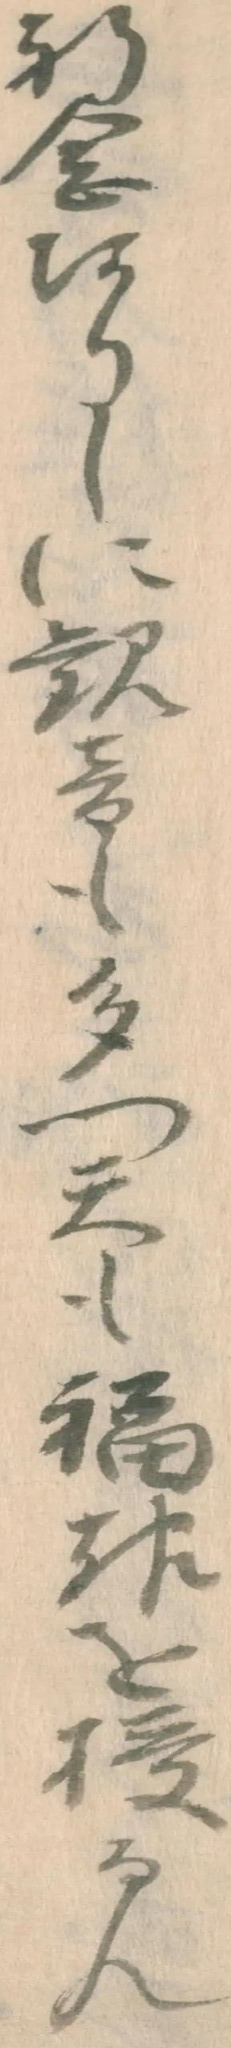祈念ありしに観音も多門天も福報を授なん
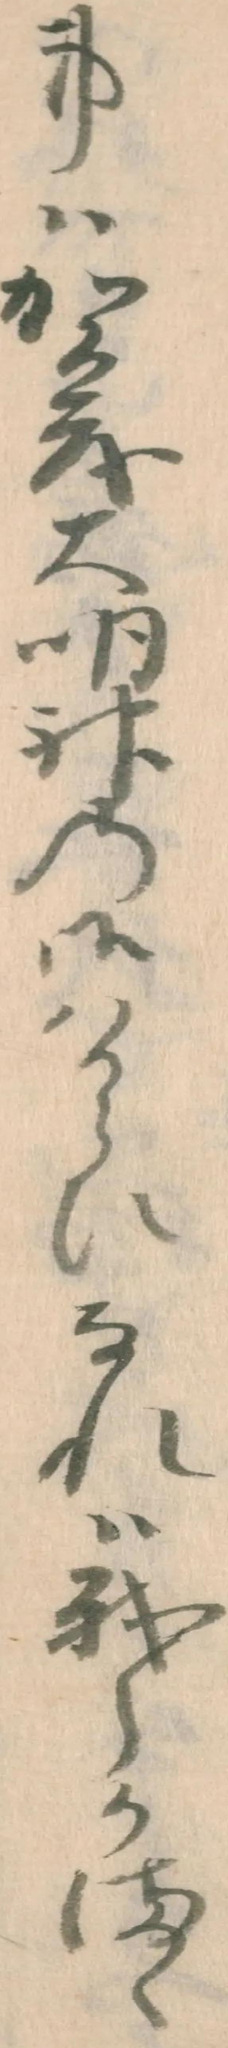事は賀茂大明神の御はからひなれは我らかまゝ
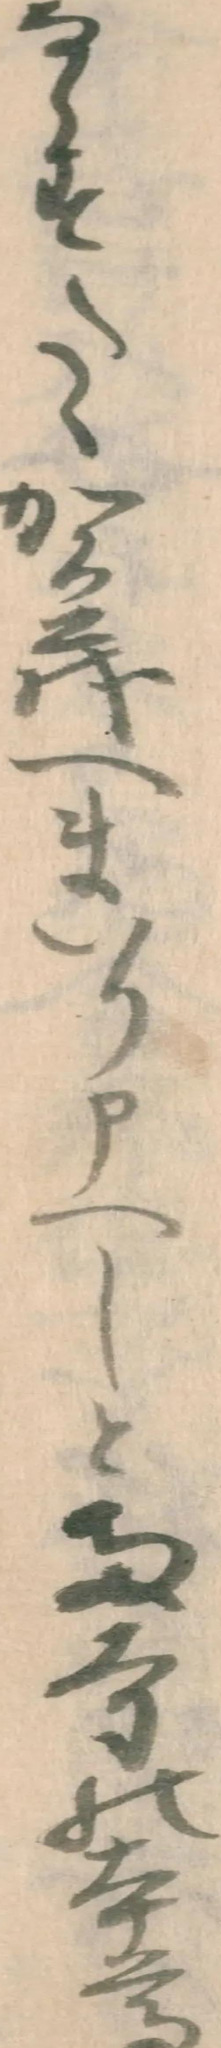ならすたゝ賀茂へまいり申へしと両寺の本尊
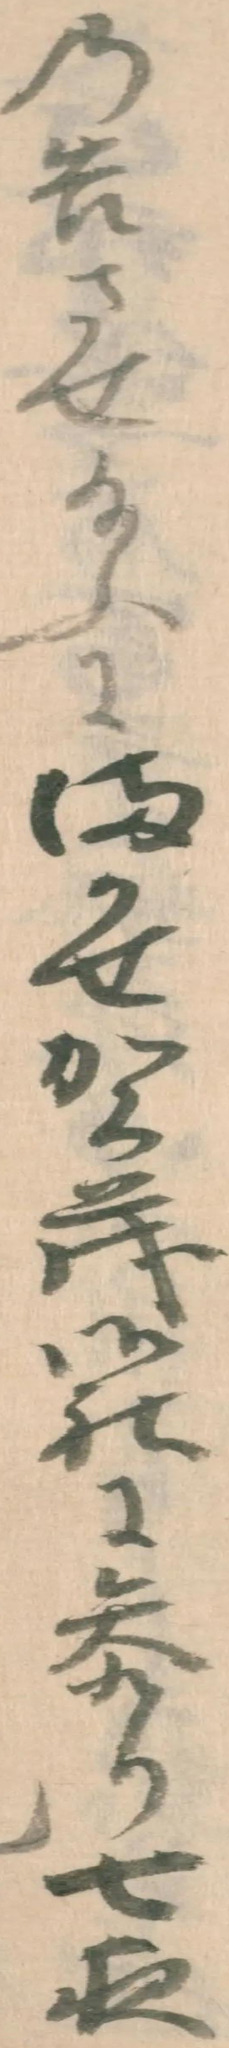の告させ給ふにまかせ賀茂御社に参り七夜
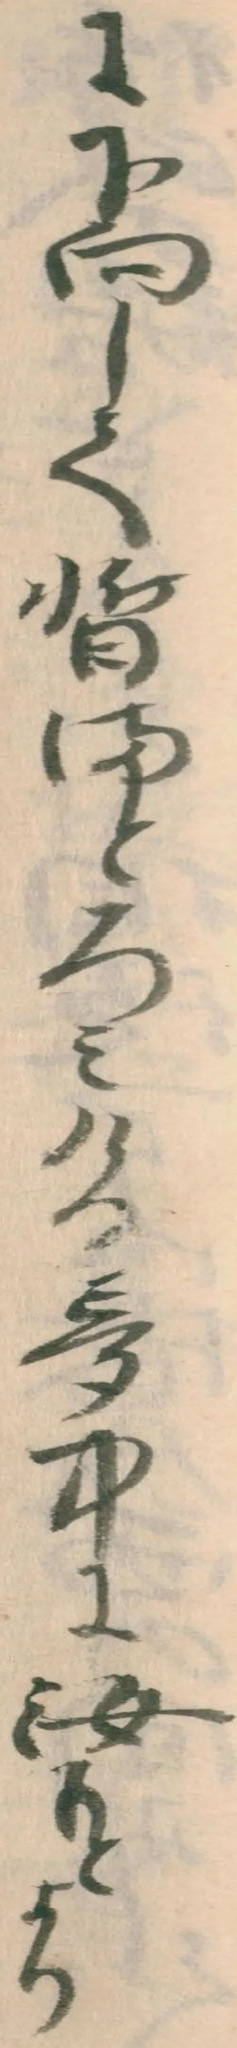に下向して暫まとろみける夢中に汝もとより
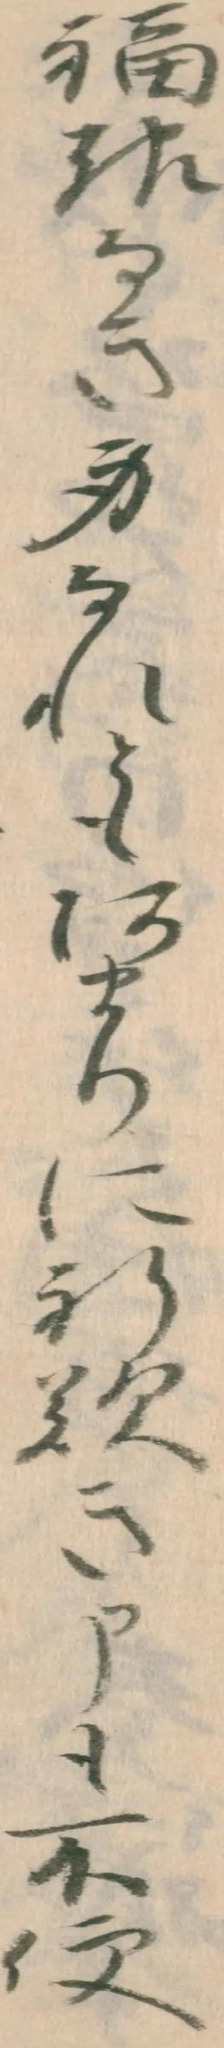福報なき身なれともあまりに祈歎き申も不便
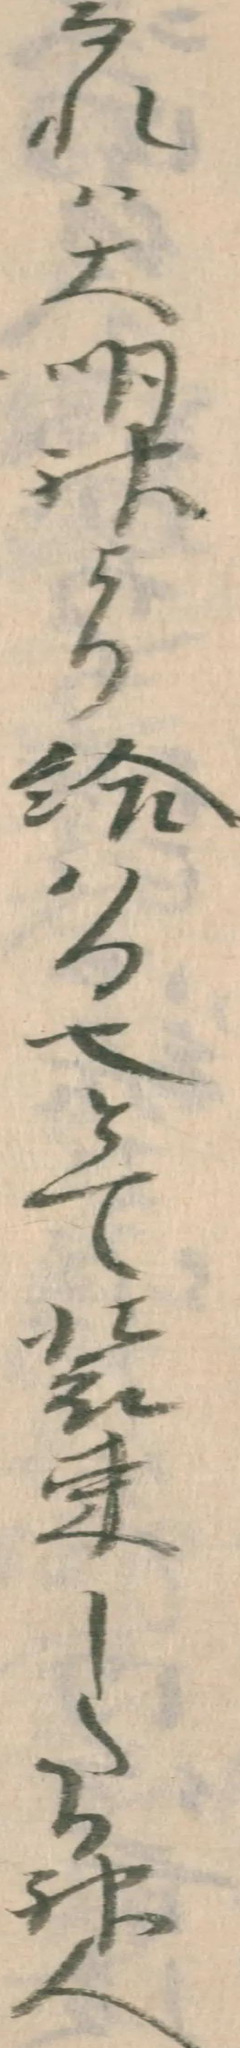なれは大明神より給はる也とて装束したる神人
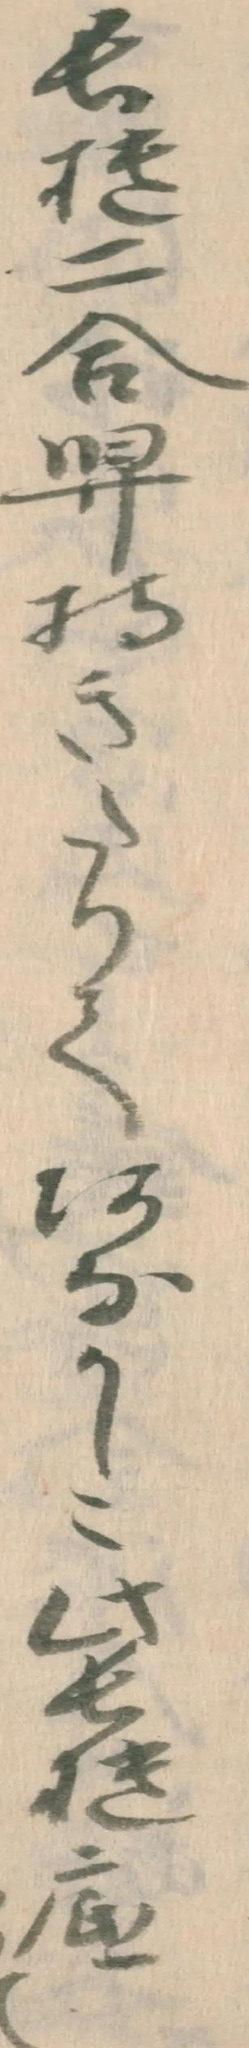長櫃二合舁持きたりてあなかしこ此長櫃底まて
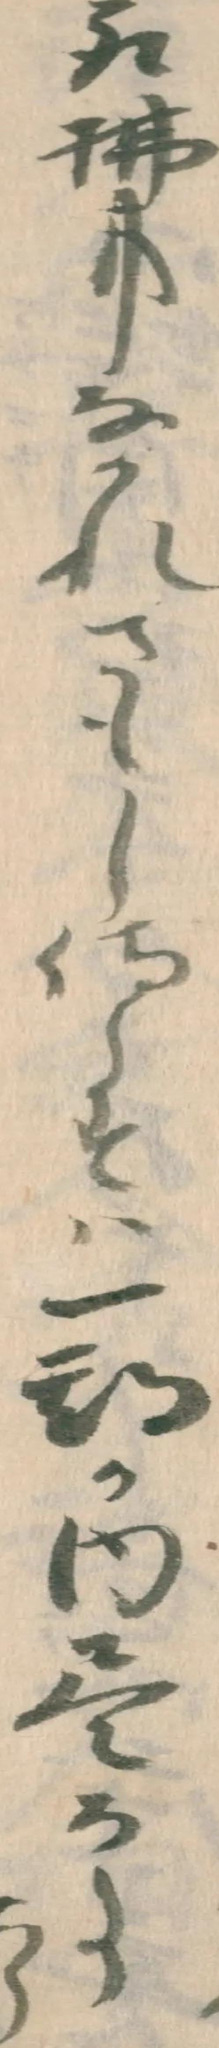取払事なかれさもし侍らすは一期か内尽る事あらし
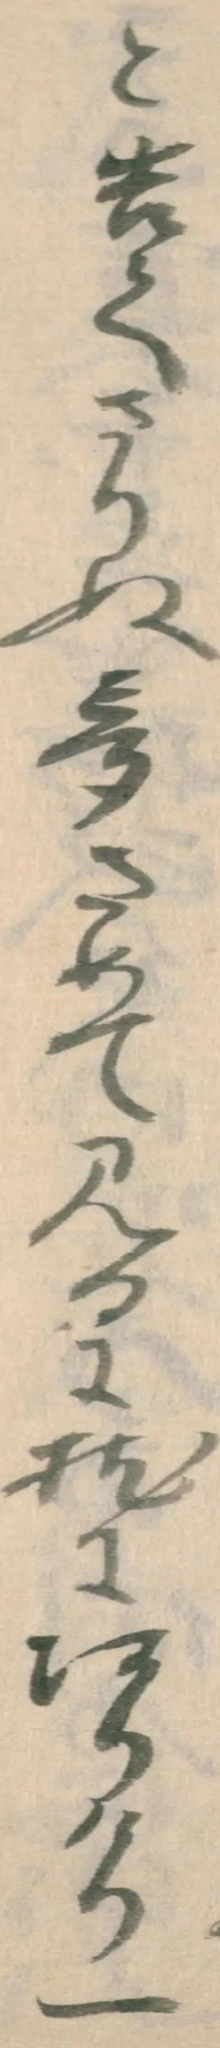と告てさりぬ夢さめて見るに枕にありけり一
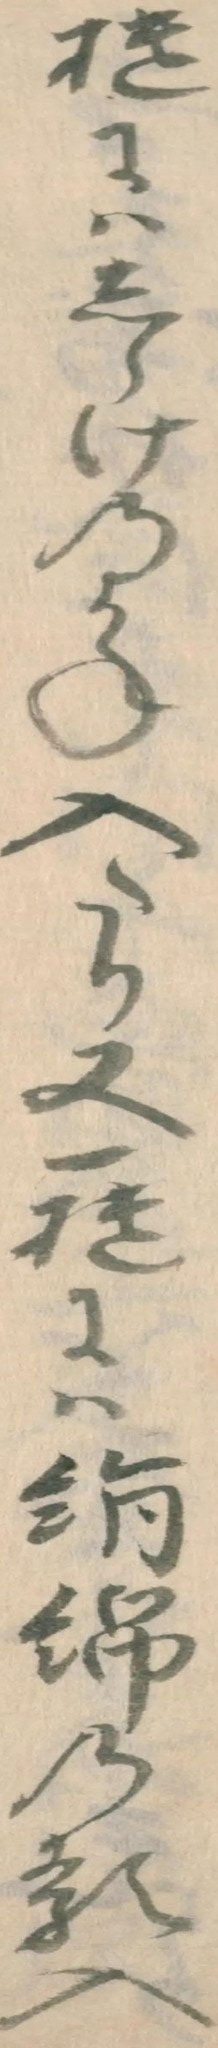櫃にはしらけのよね入たり又一櫃には絹綿の類入
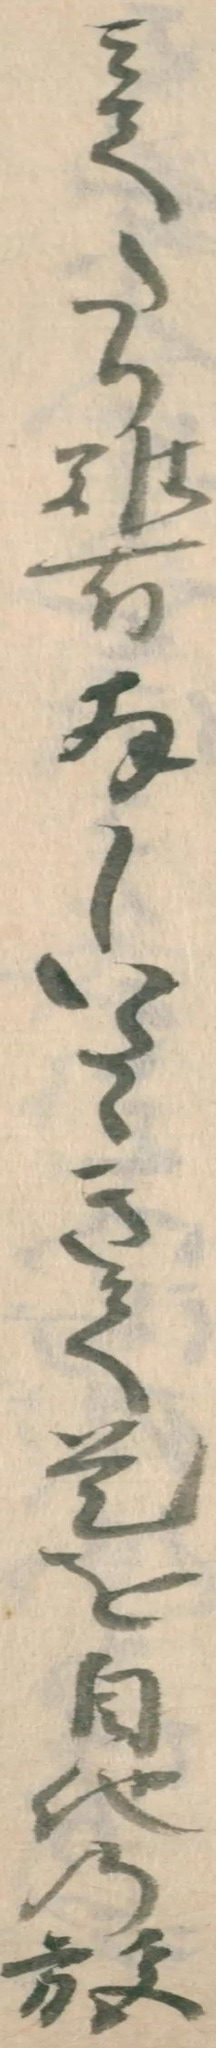みてたり難有拝しいたゝきて是を自他の施
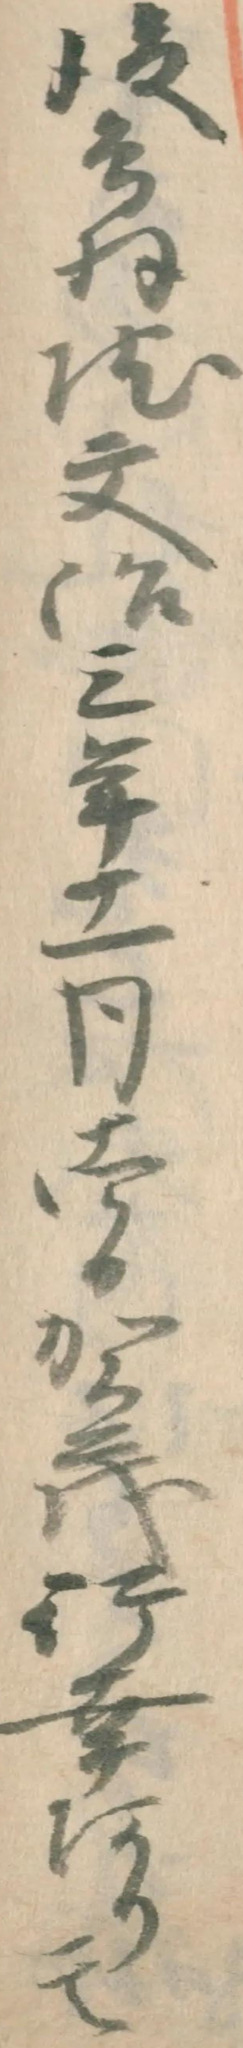後鳥羽院文治三年十一月十四日賀茂行幸あり其

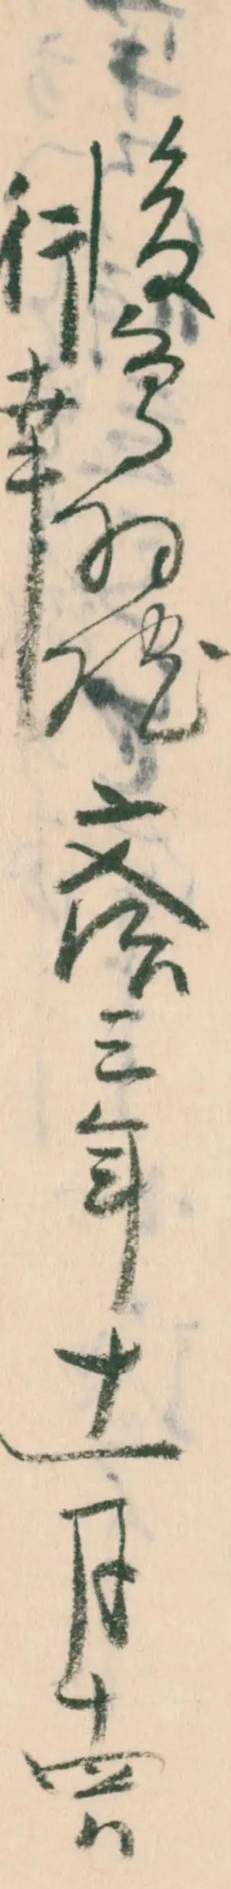後鳥羽院文治三年十一月十四日

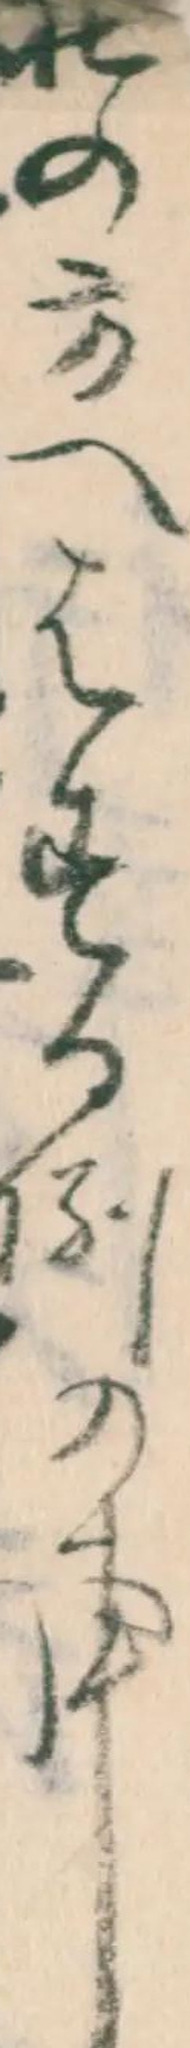社の方へはする例の事
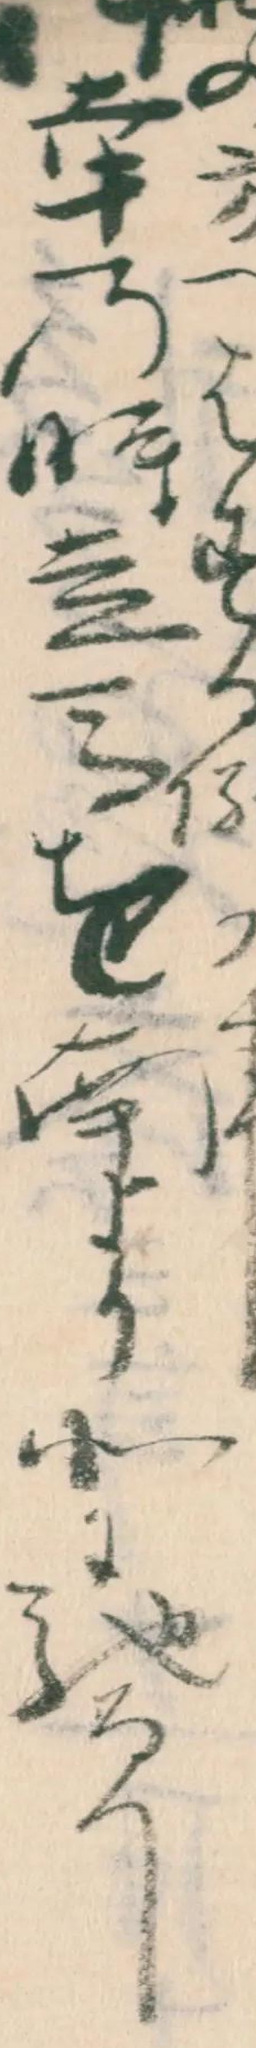行幸の時走馬を南より北に馳るコト
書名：賀茂社記録. 第1冊
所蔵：国立国会図書館 National Diet Library, JAPAN
